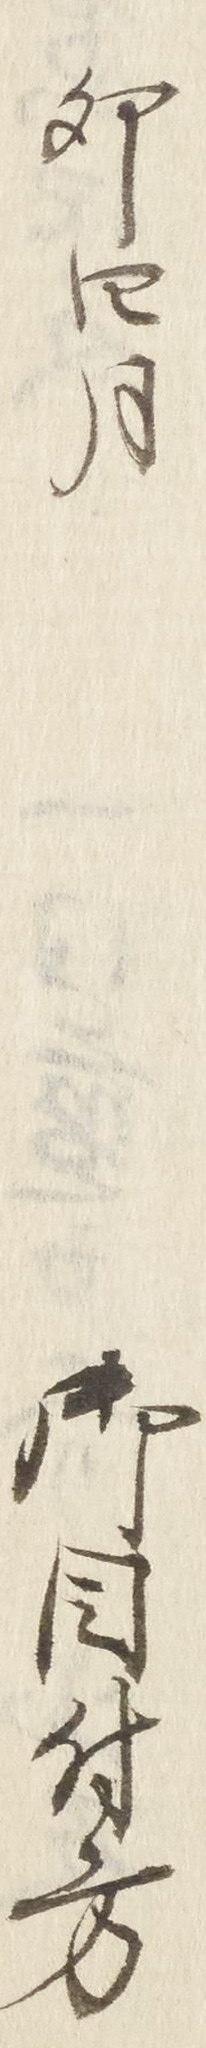卯四月御目付方
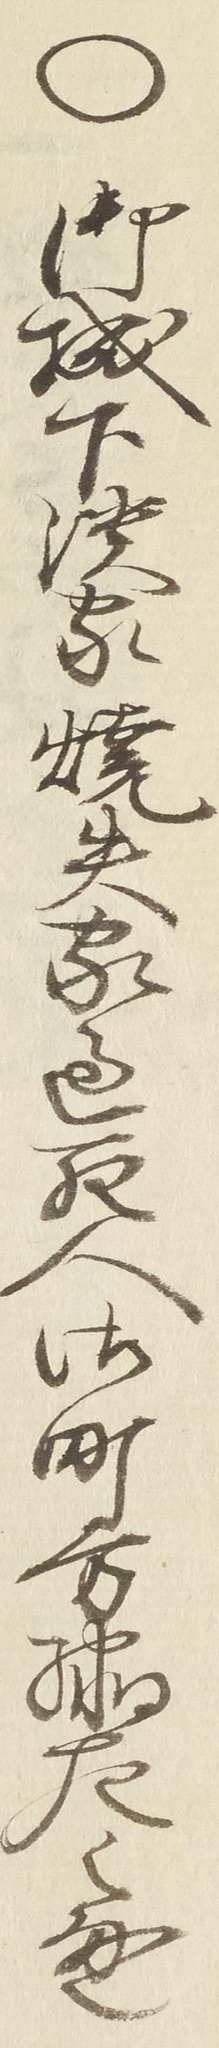◯御城下潰家焼失家過死人御町方縮左之通
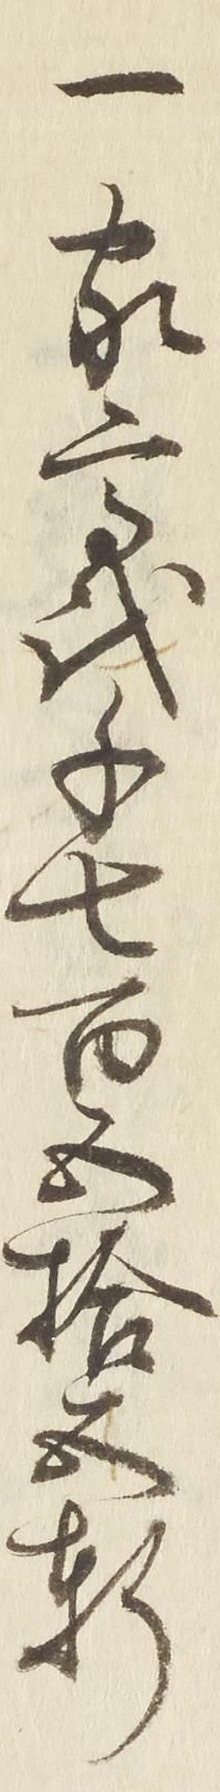一家高弐千七百五拾五軒
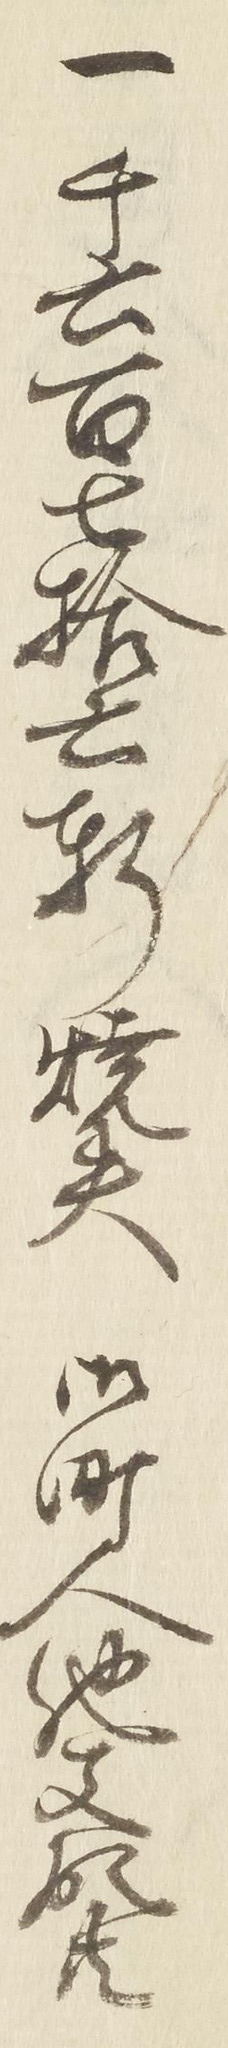一千六百七拾六軒焼失御町人他支配共
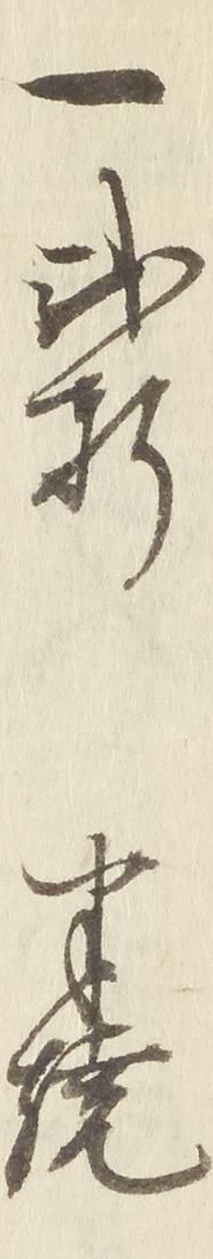一弐軒半焼
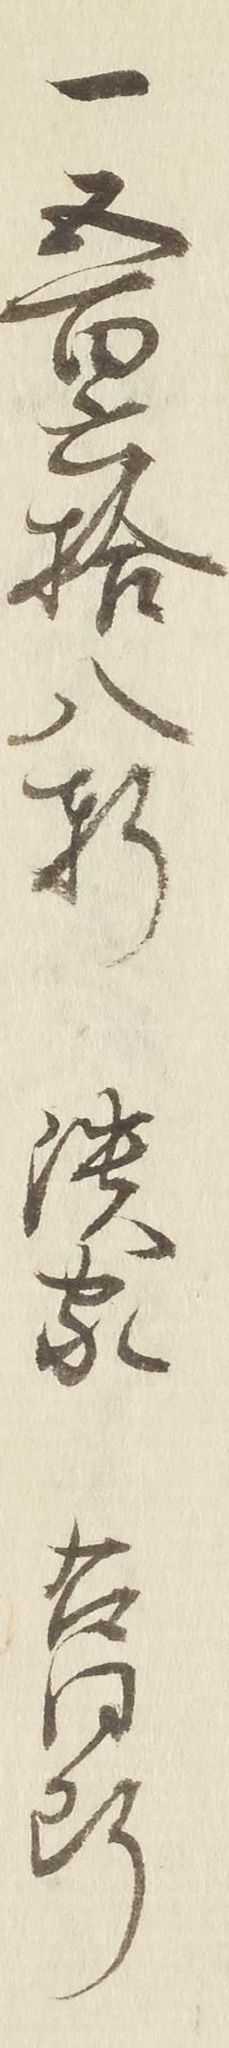一五百六拾八軒潰家右同断
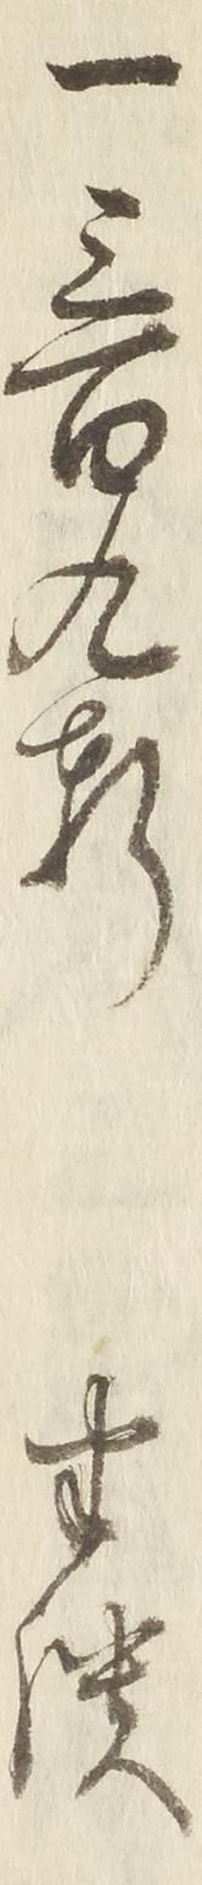一三百九軒半潰
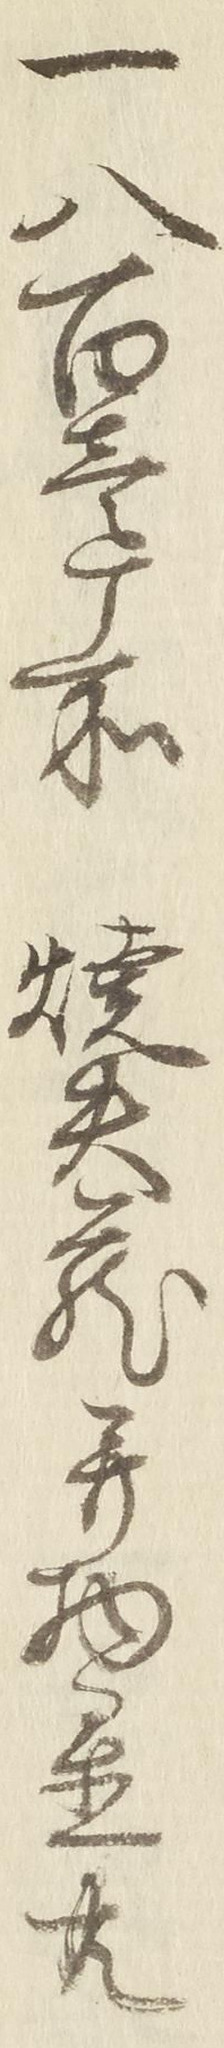一八百壱ヶ所焼失蔵并物置共
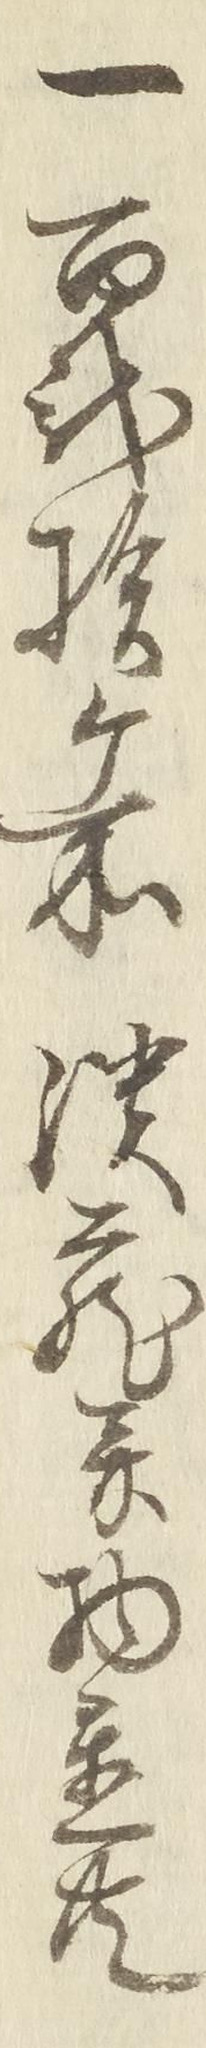一百弐拾ヶ所潰蔵并物置共
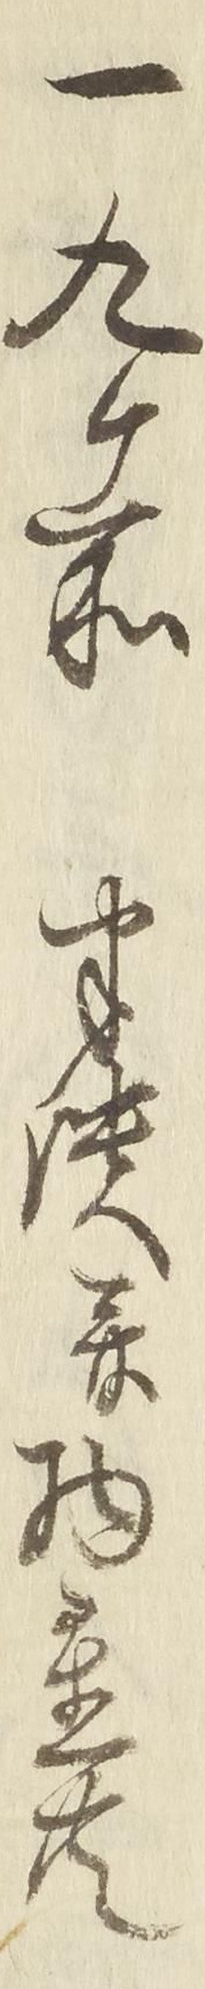一九ヶ所半潰并物置共

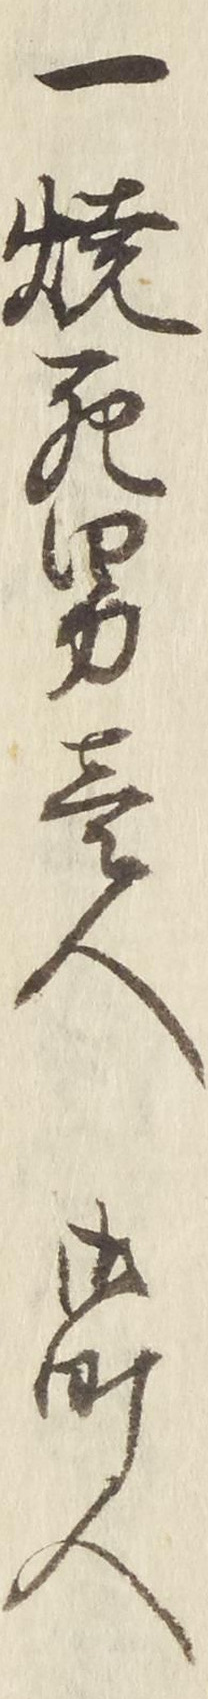一焼死男壱人御町人
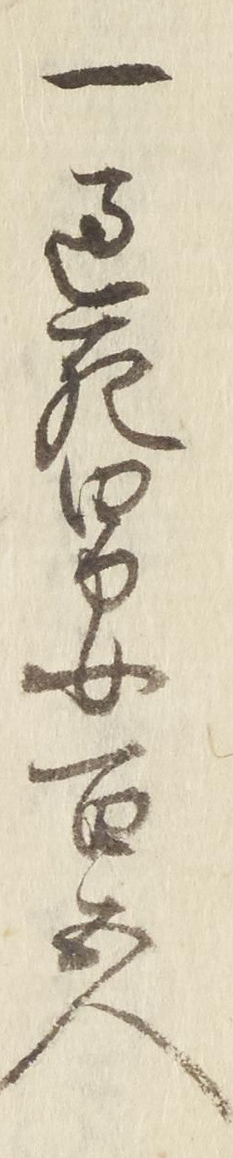一過死男女百五人
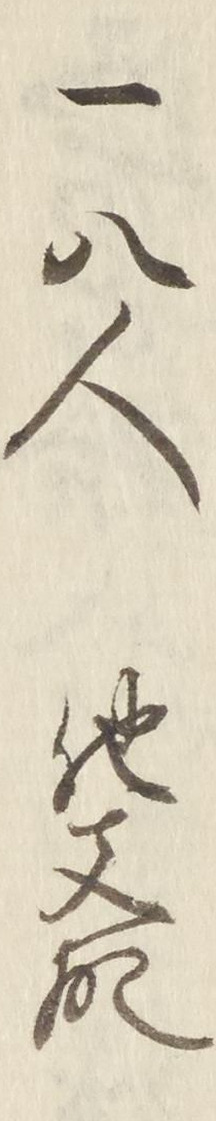一八人他支配
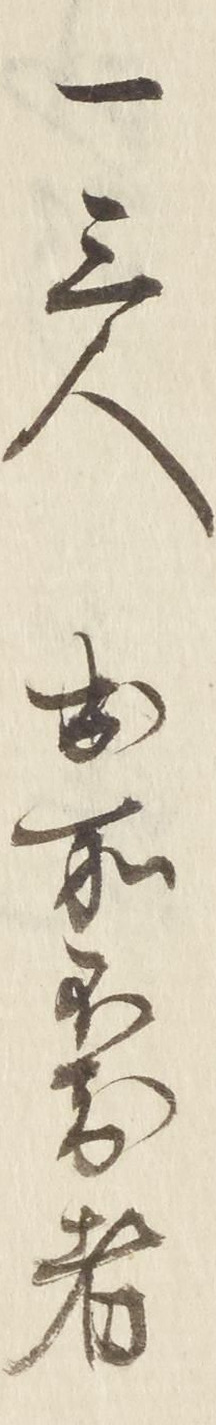一三人出所不知者
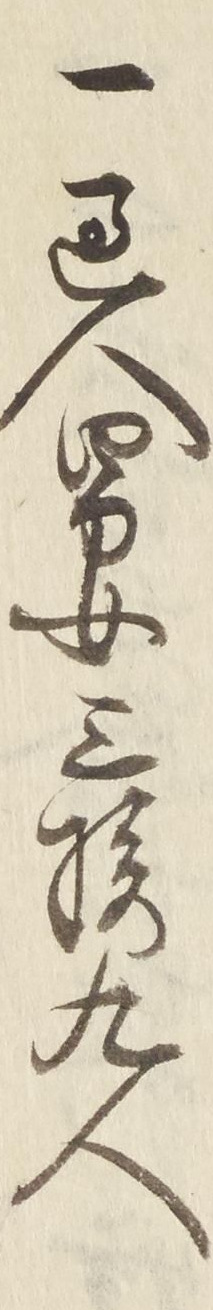一過人男女三拾九人
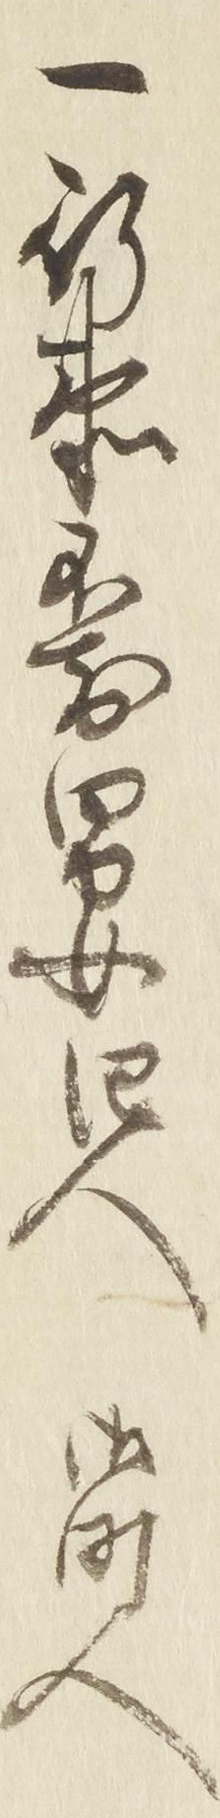一行衛不知男女四人御町人
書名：地震記　下
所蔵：東京大学地震研究所図書室 Earthquake Research Institute Library, The University of Tokyo, JAPAN
